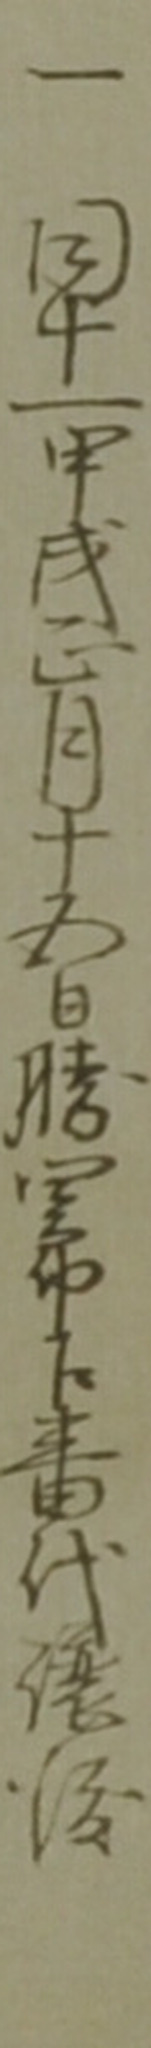一同十一甲戌正月十五日勝四郎江番代譲渡
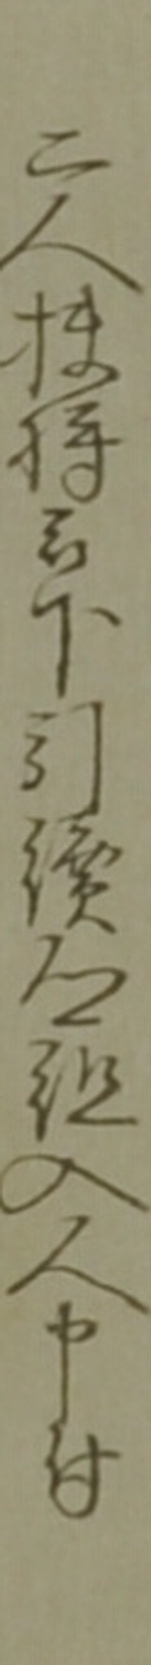二人扶持被下引続郷組入人申付
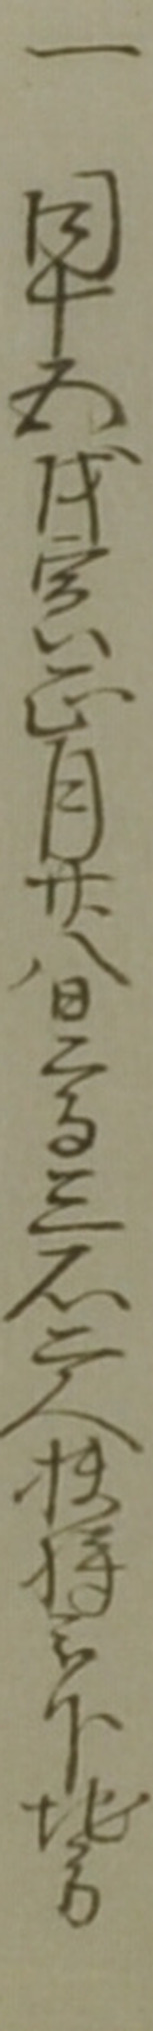一同十五戊寅正月廿八日高三石二人扶持被下地方
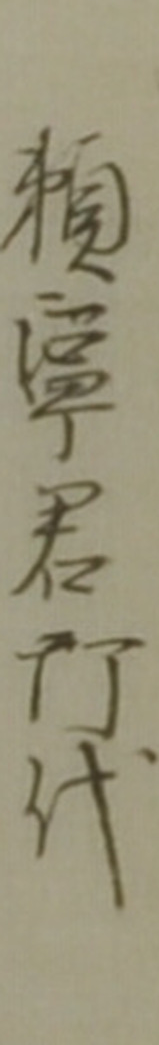頼寧君御代
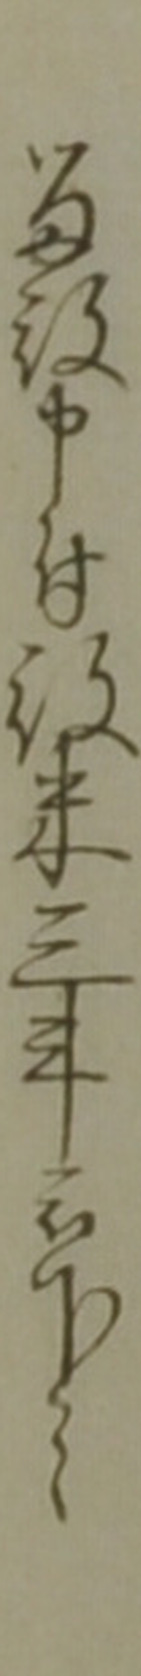留役申付役米三斗被下之
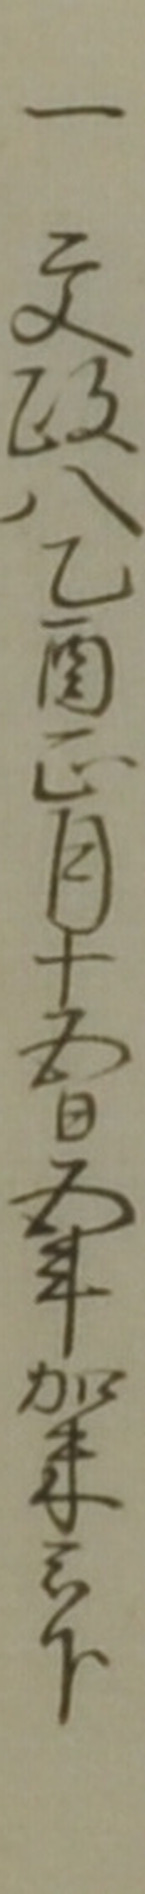一文政八乙酉正月十五日五斗加米被下
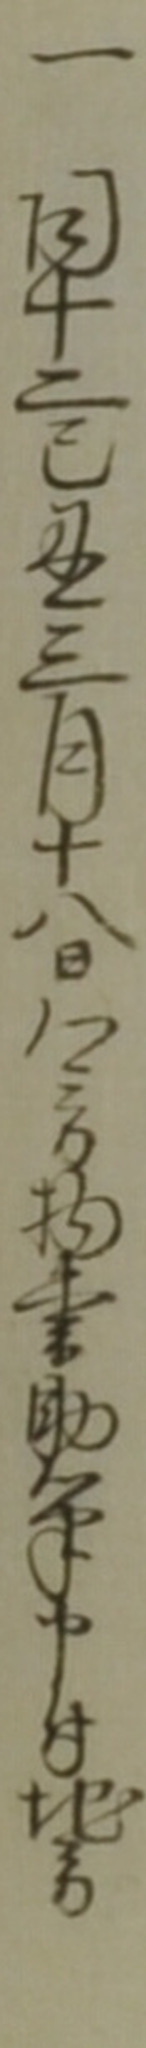一同十二己丑三月十八日郷方物書助筆申付地方
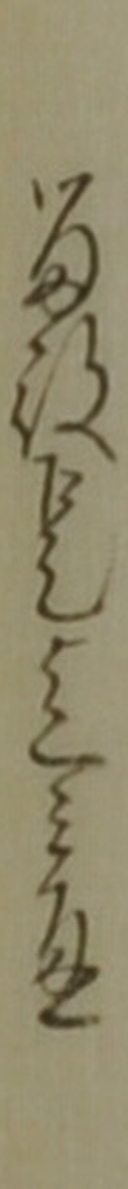留役是迄之通
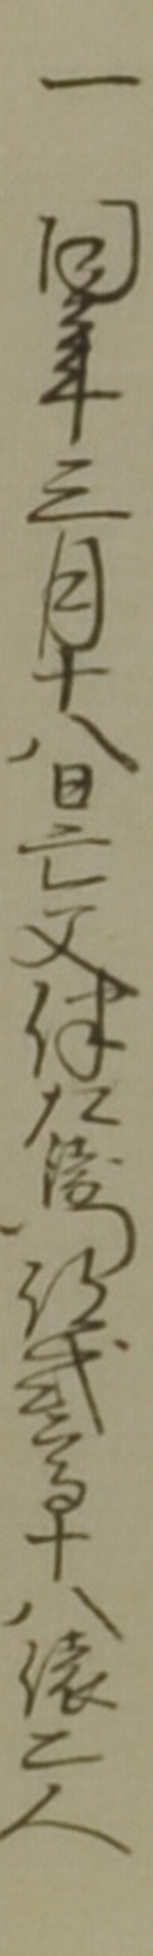一同年三月十八日亡父伴左衛門跡式高十八俵二人
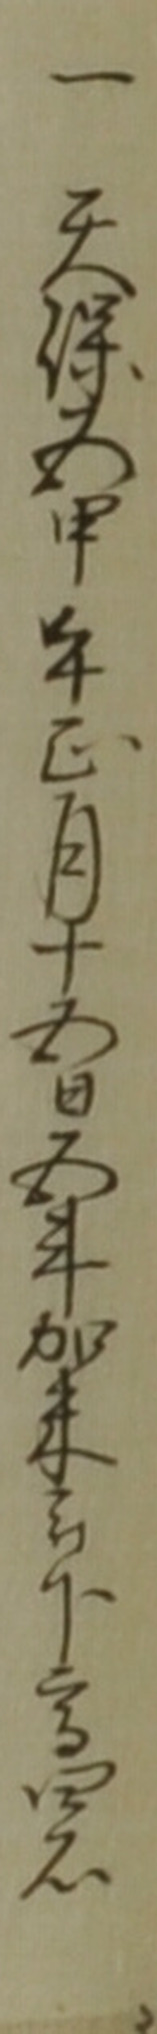一天保五甲午正月十五日五斗加米被下高四石
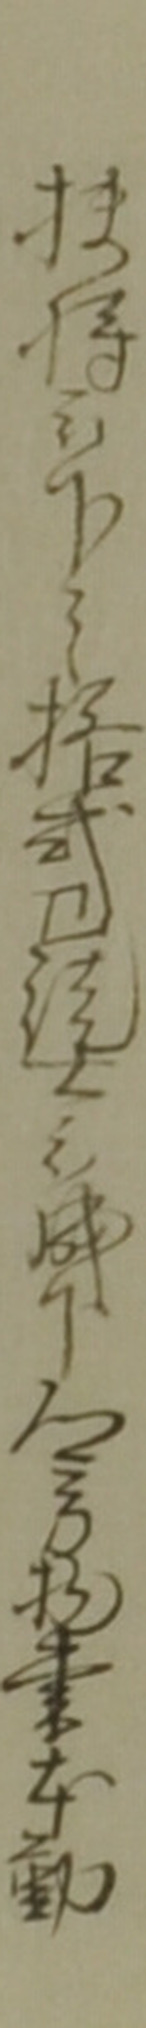扶持被下之格式御徒士被成下郷方物書本勤
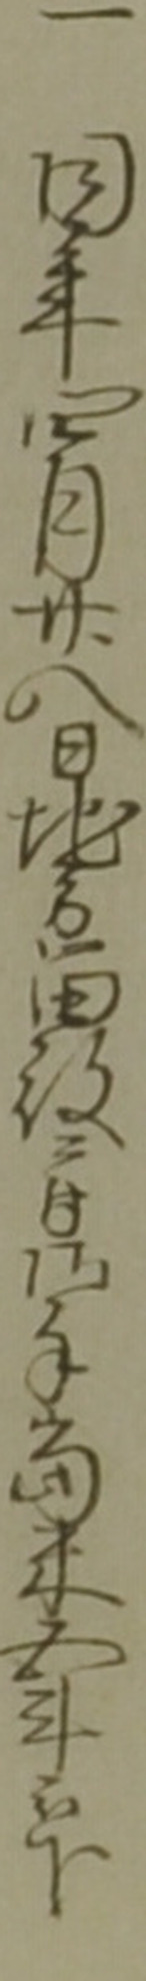一同年四月廿八日地方留役ニ付御手当米五斗被下
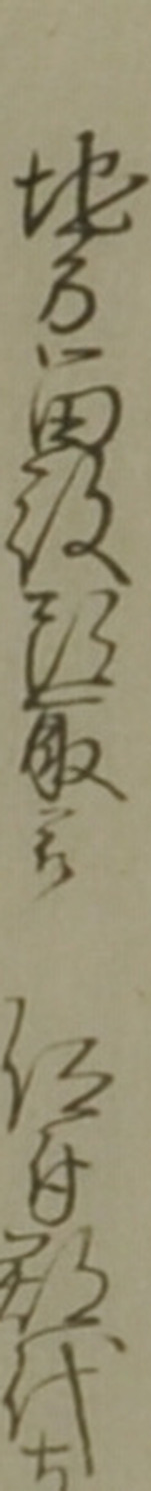地方留役頭取被仰付郡代支配
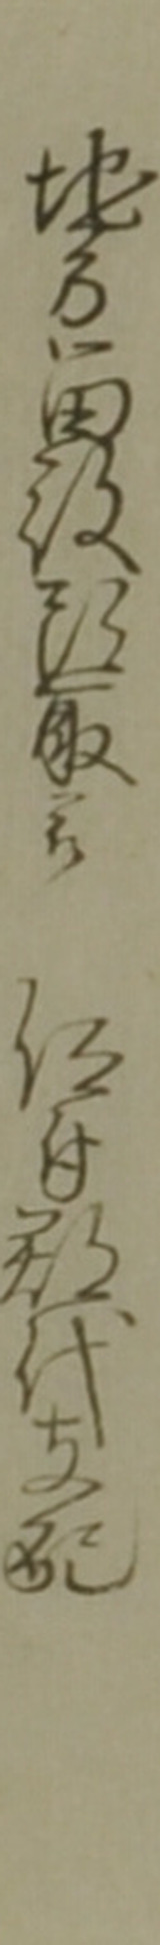地方留役頭取被仰付郡代支配
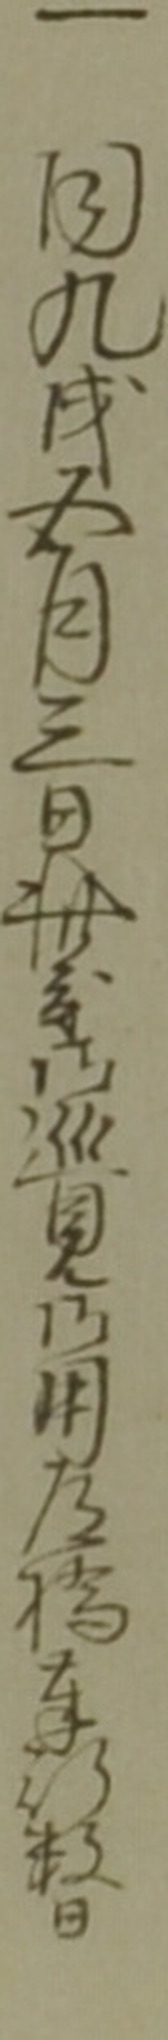一同九戌五月三日此度御巡見御用道橋奉行数日
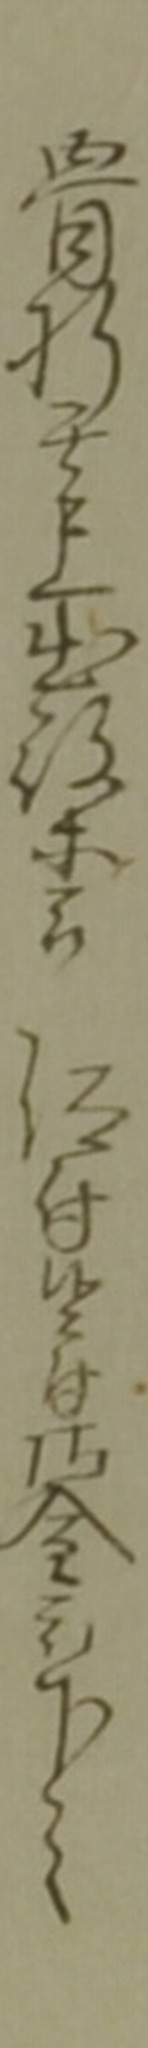骨折其上出役等被仰付候ニ付御金被下之
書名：無足諸士勤仕録（六）
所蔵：伊那市立高遠町図書館・合同会社AMANE
